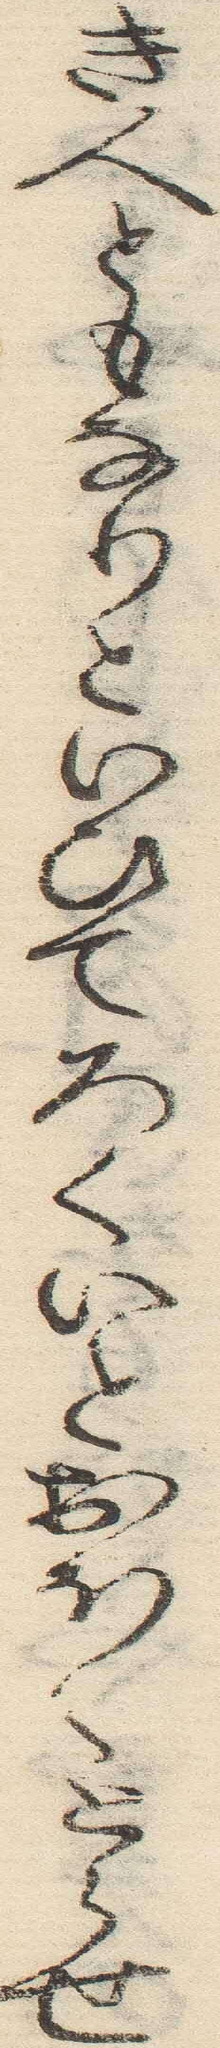き人ともなりといひてろくいとおほくとらせ
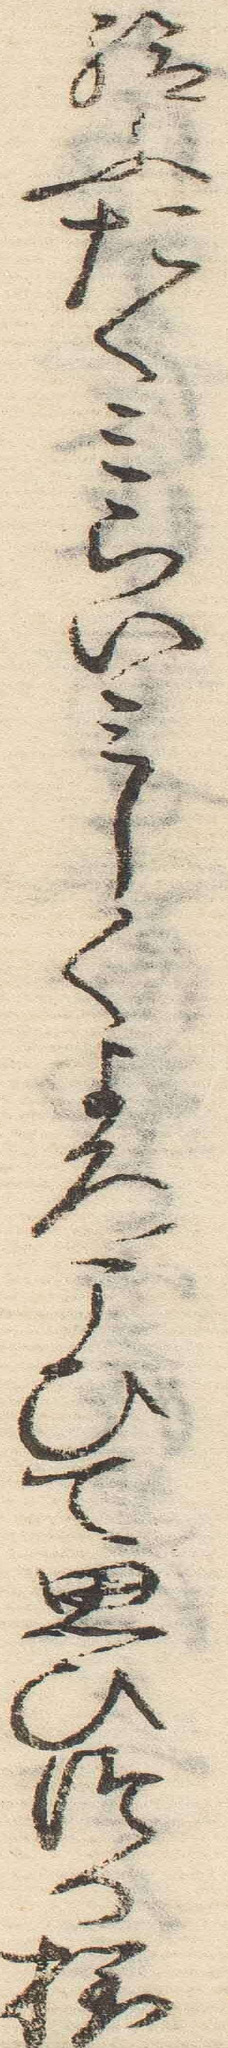給ふたくみらいみしくよろこひて思ひつる様
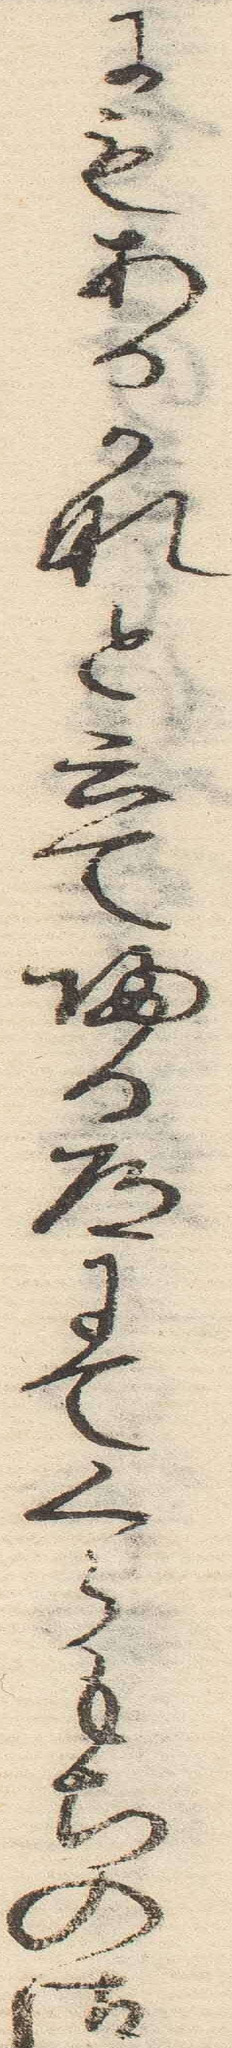にもあるかなと云て帰る道にてくらもちの御
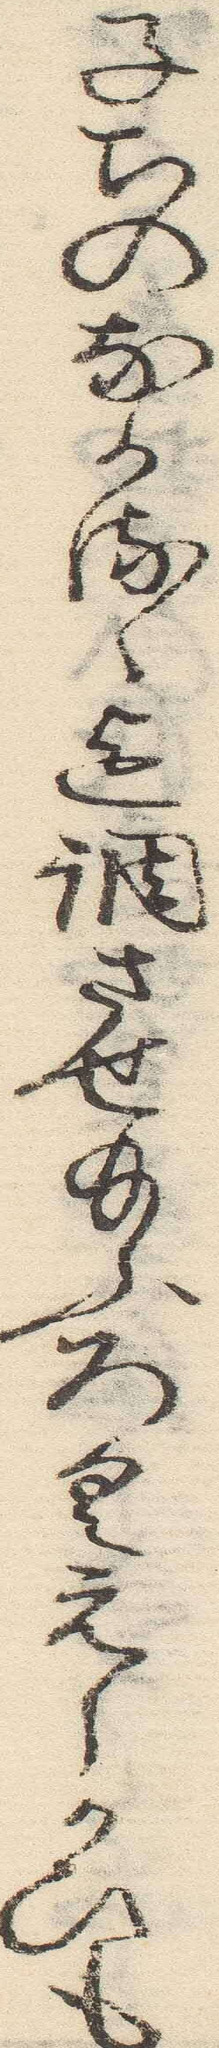子ちのなかるゝ迄調させ給ふろくえしかひも
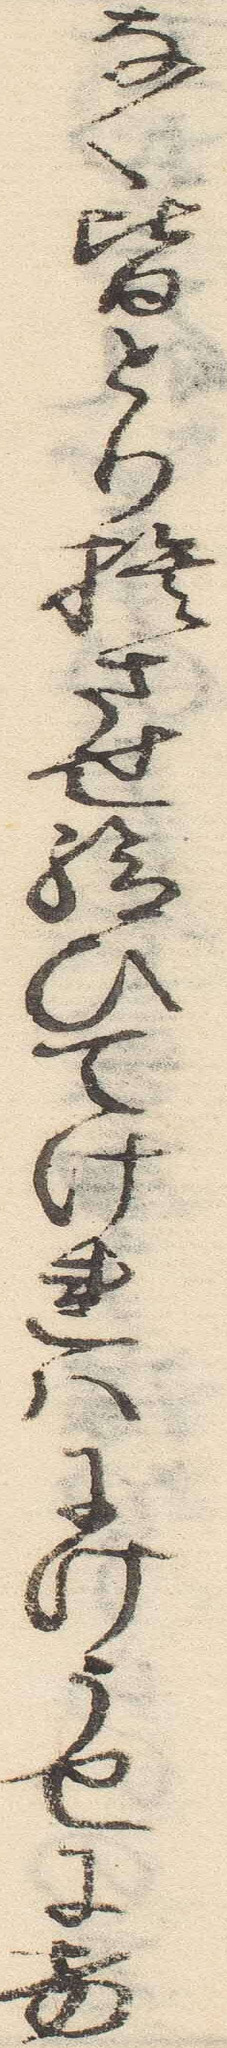なく皆とり捨させ給ひてけれはにけうせにけ
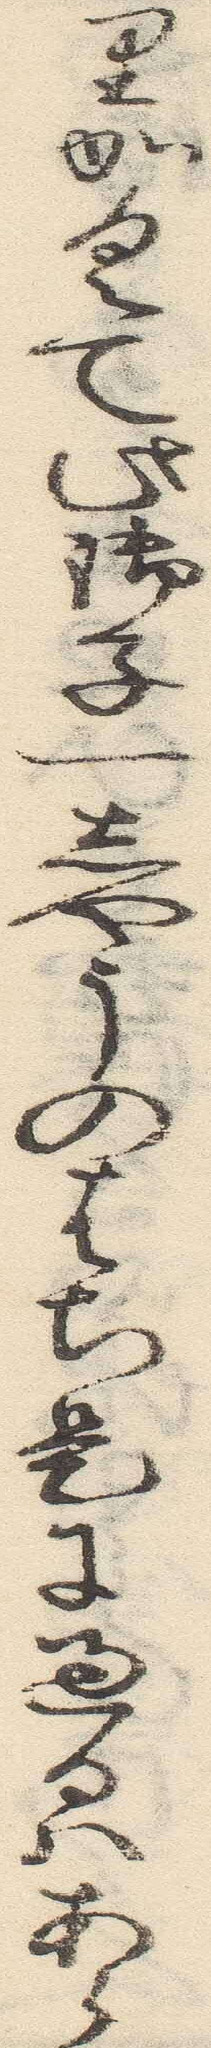りかくて此御子一しやうのはち是に過るはあら
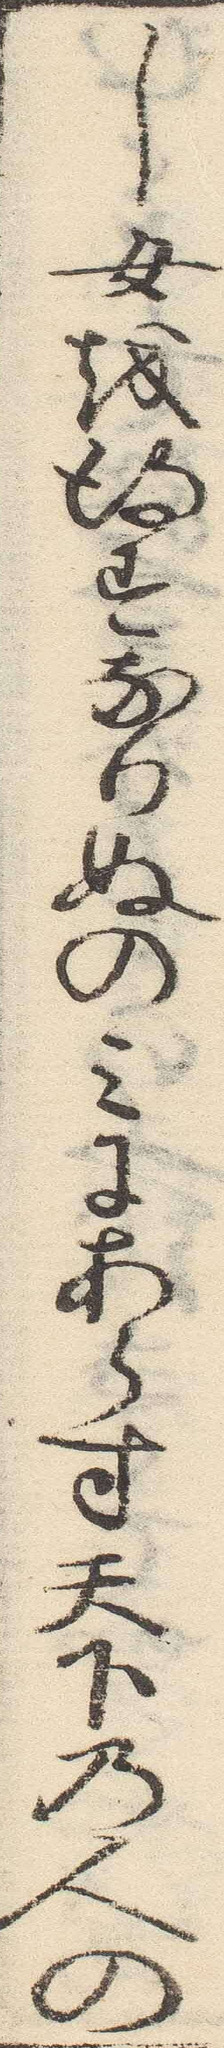し女を得すなりぬのみにあらす天下の人の
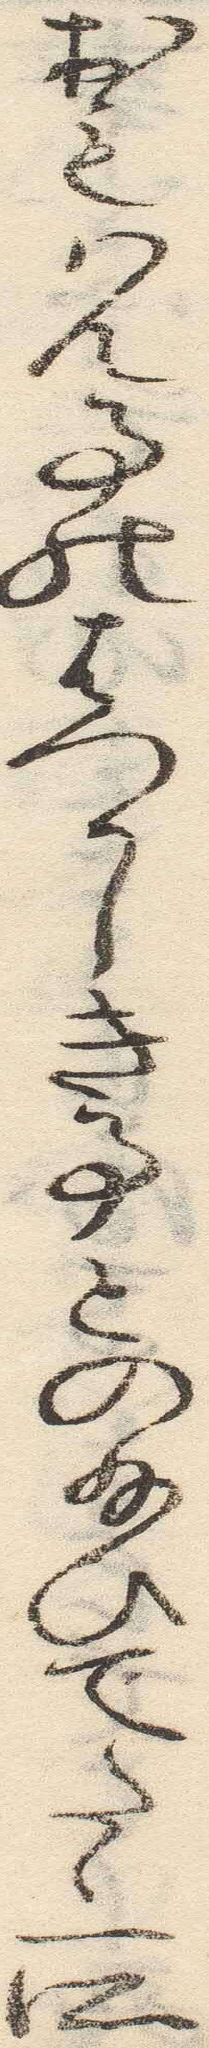おもはん事のはつかしき事との給ひてたゝ一所
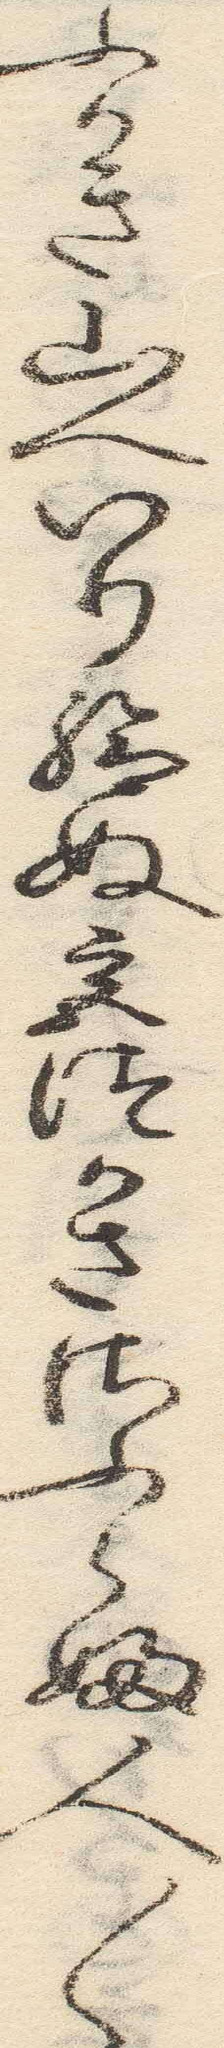ふかき山へいり給ぬ宮つかささふらふ人々
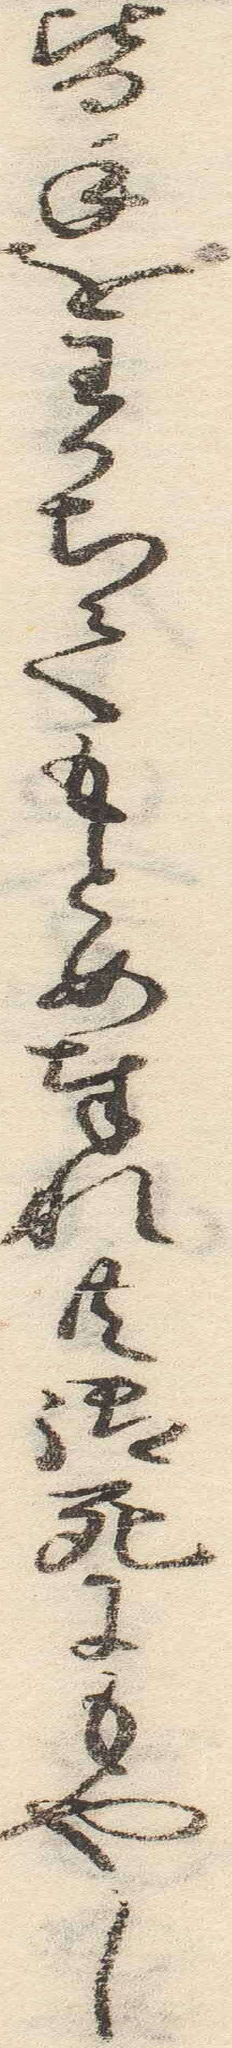皆手をわかちてもとめ奉れ共御死にもやし
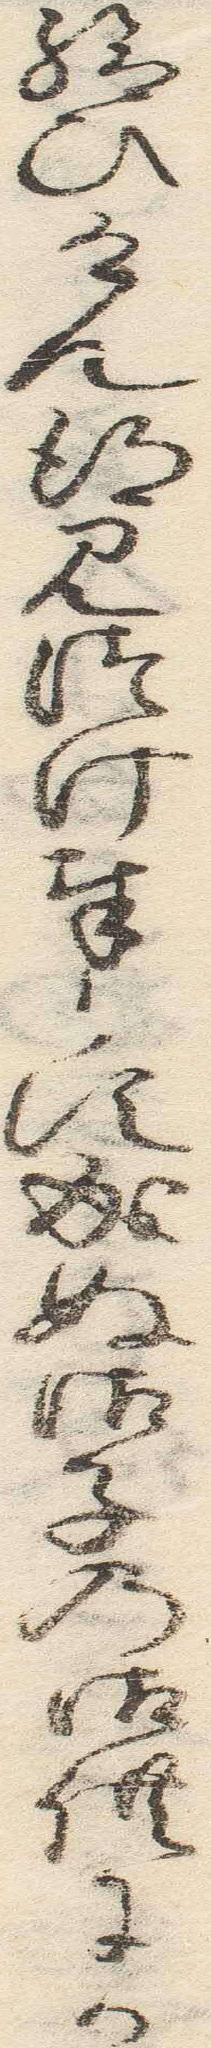給ひけん得見つけ奉らす成ぬ御子の御供にか
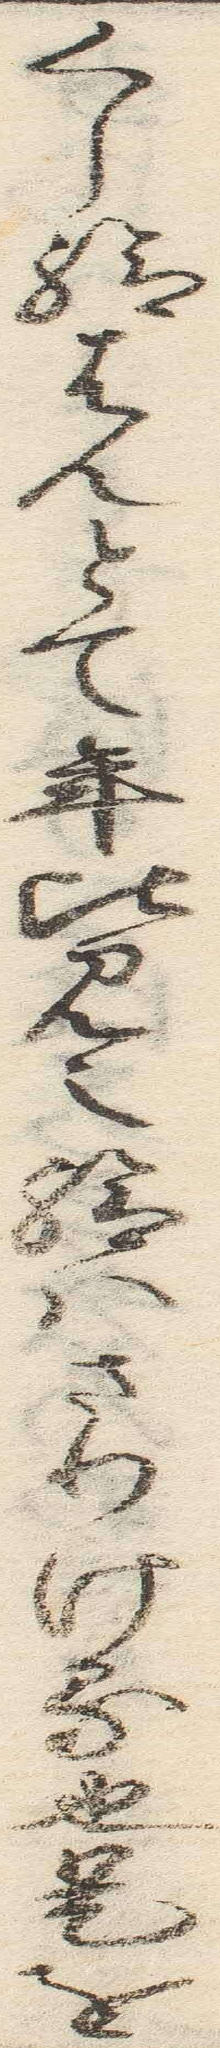くし給はんとて年頃見え給はさりける也是を
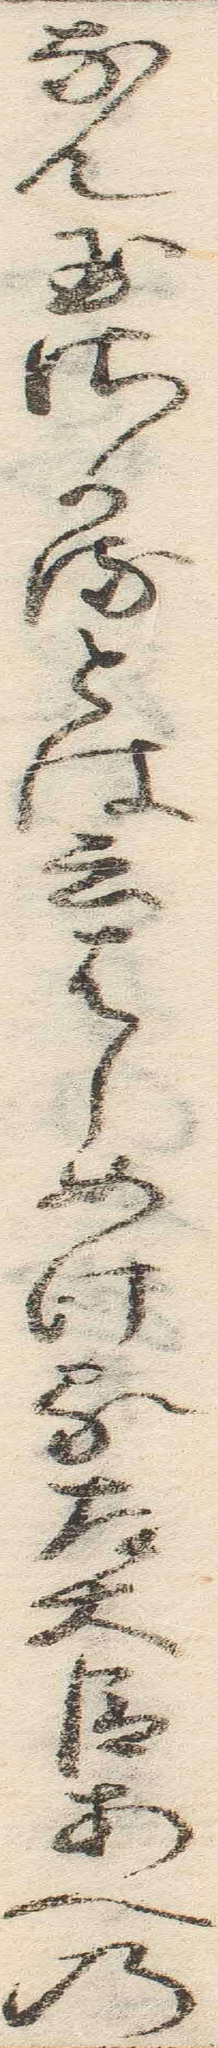なん玉さかるとは云はしめける左大臣あへの
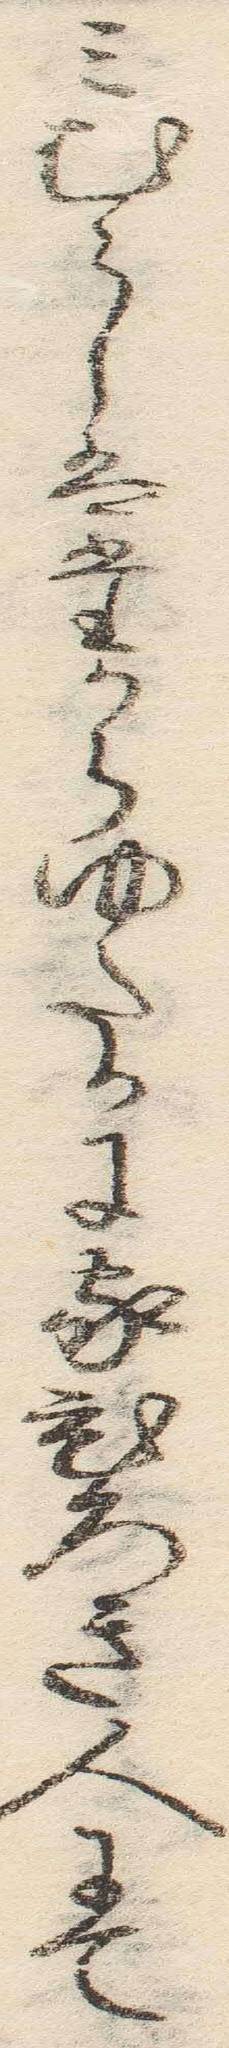みむらしはたからゆたかに家ひろき人にて
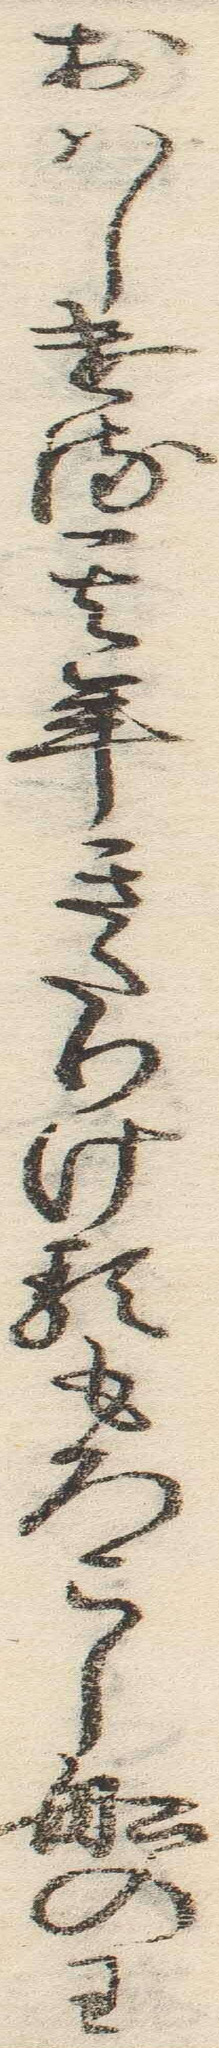おはしける其年きたりけるもろこし舟のわ
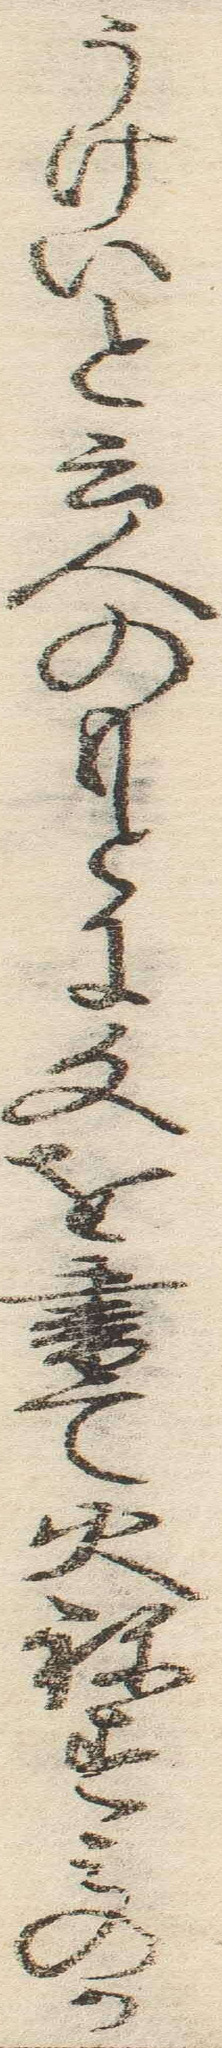うけいと云人のもとに文を書て火ねすみのか
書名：竹取物語
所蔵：東京学芸大学附属図書館 国文学研究資料館
